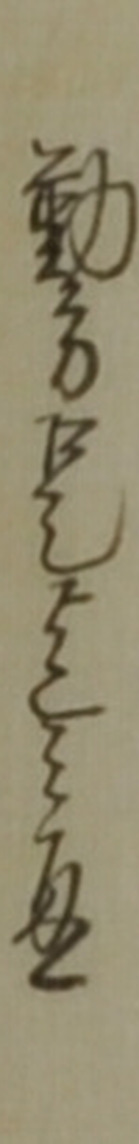勤方是迄之通
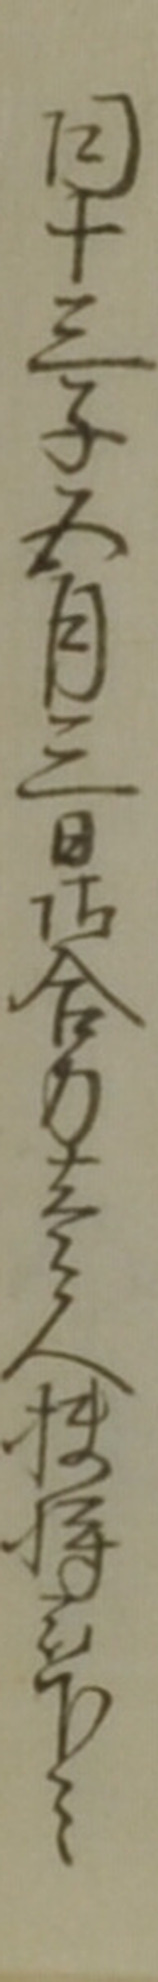一同十三子五月三日御合力壱人扶持被下之
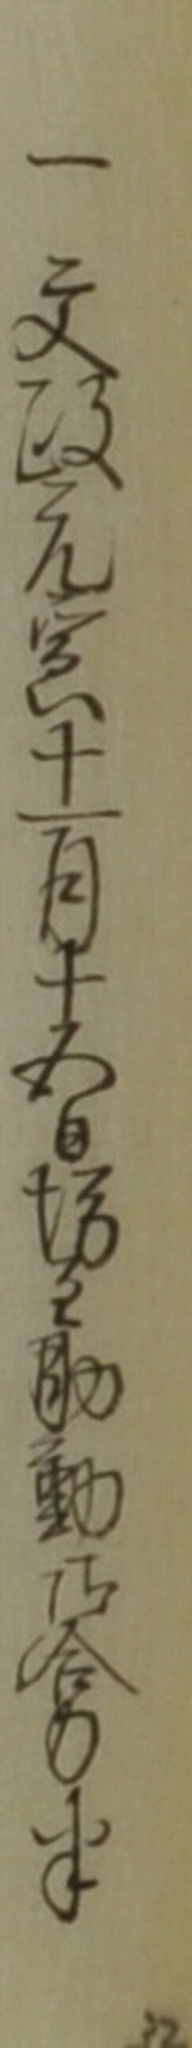一文政元寅十一月十五日坊主助勤御合力半
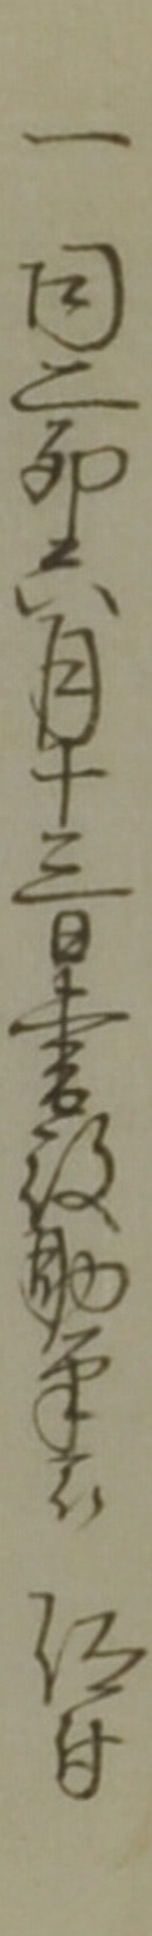一同二卯六月十三日書役助筆被仰付
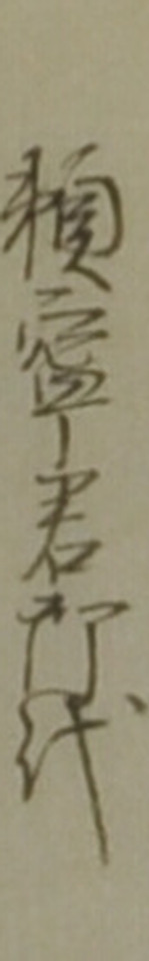頼寧君御代
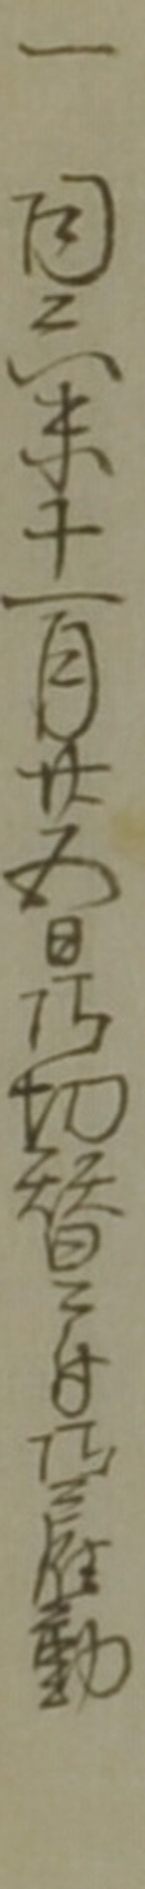一同六未十一月廿五日御切替ニ付御雇勤
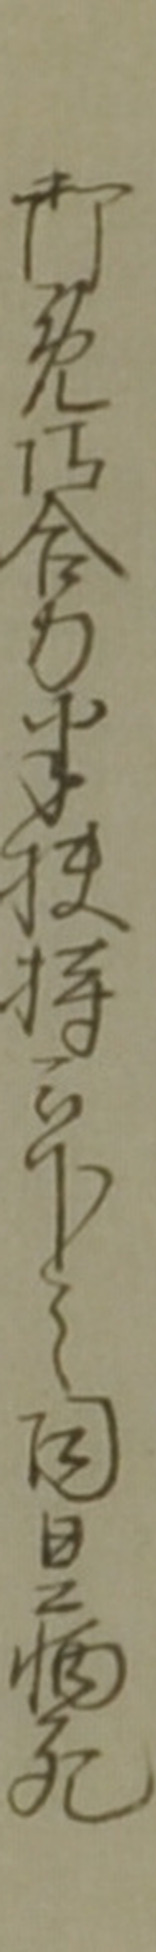御免御合力半扶持被下之同日病死
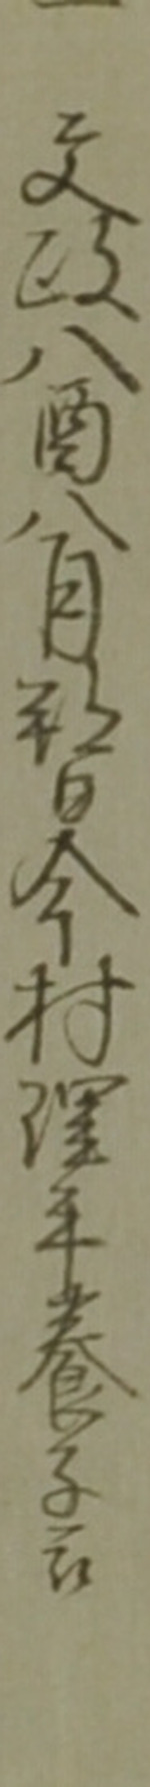一文政八酉八月朔日今村理平養子被

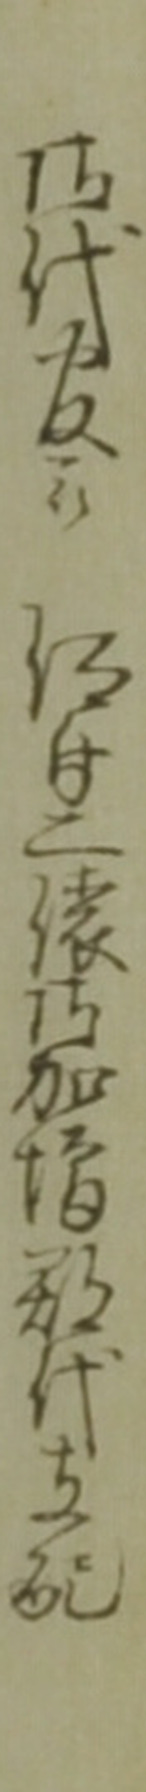御代官被仰付二俵御加増郡代支配
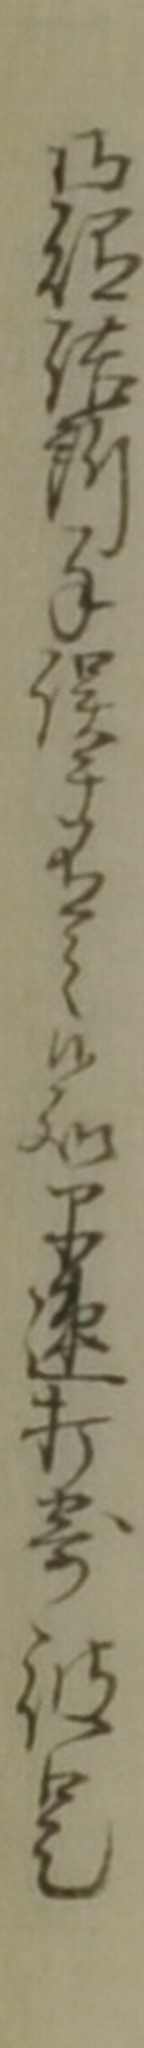御賄詰所手俟チ有之候処早速打寄彼是
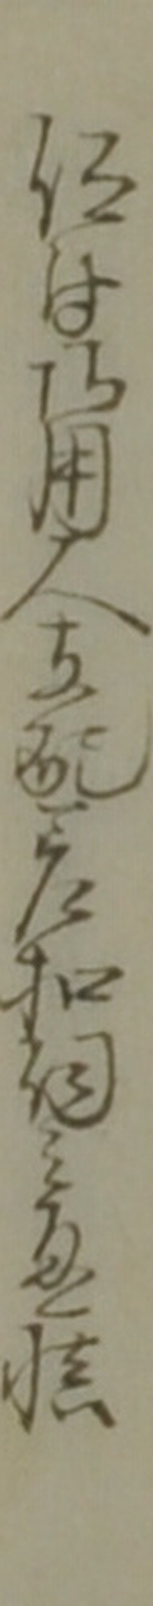仰付御用人支配差控伺之通慎
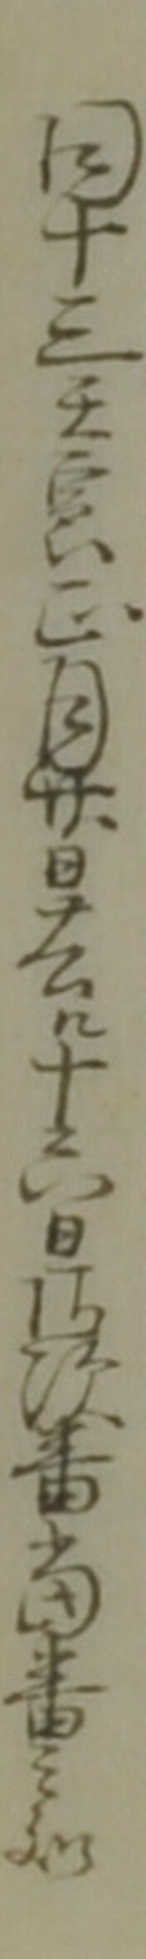一同十三壬寅正月廿日去ル十六日御次番当番之処
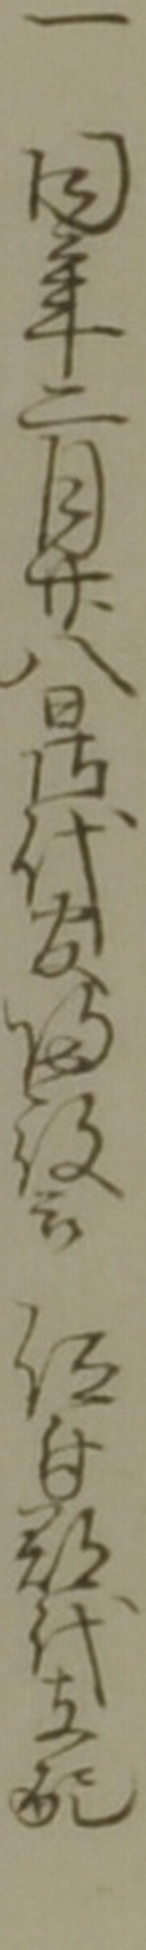一同年二月廿八日御代官帰役被仰付郡代支配
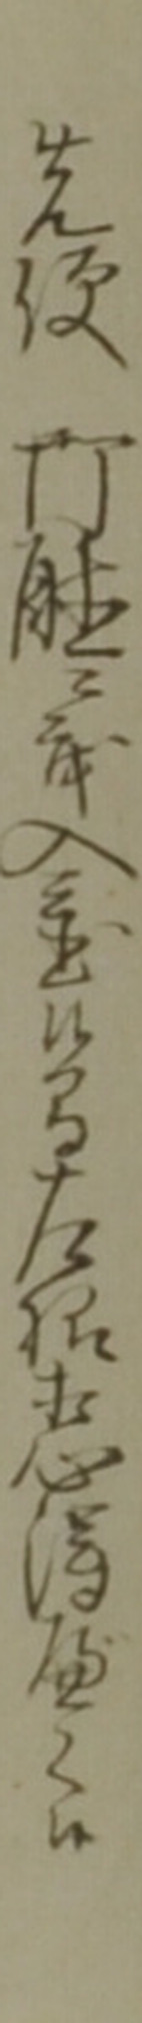先便御聴ニ茂入置候間左様相心得へく候
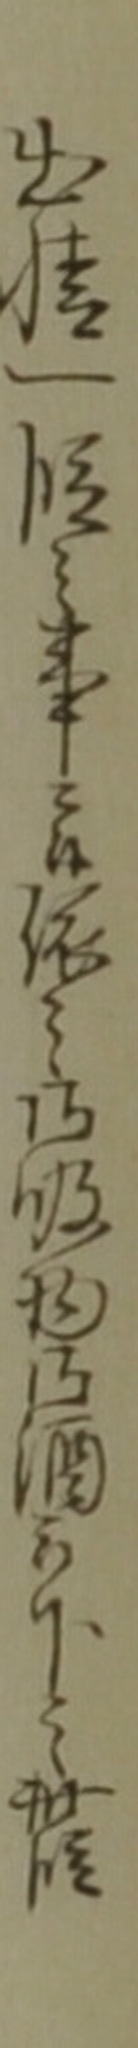出精一段之事ニ付依之御吸物御酒被下之此段
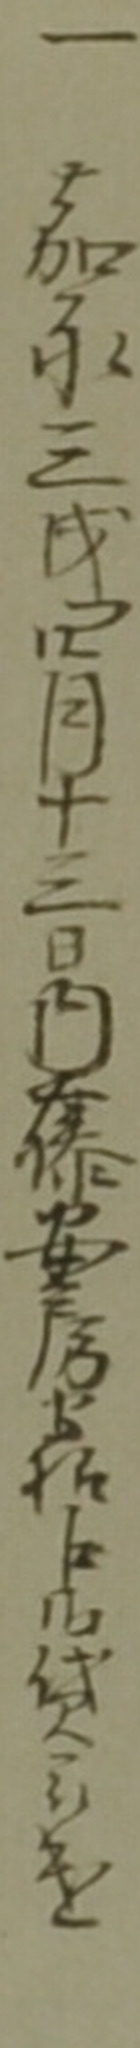一嘉永三戌四月十三日内藤安房守様江御貸被遣
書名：無足諸士勤仕録（五）
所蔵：伊那市立高遠町図書館・合同会社AMANE
